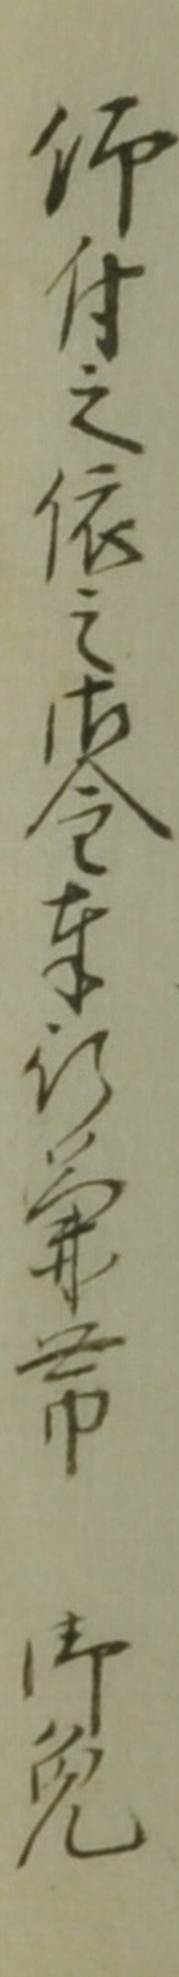仰付之依之御金奉行兼帯御免

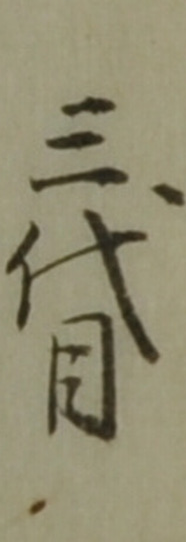三代目
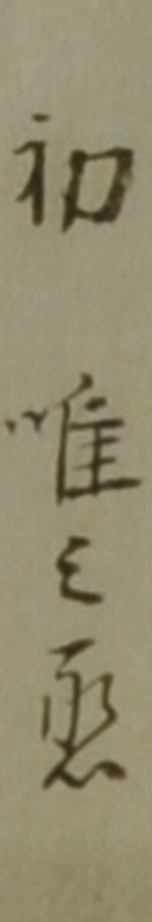初唯之丞
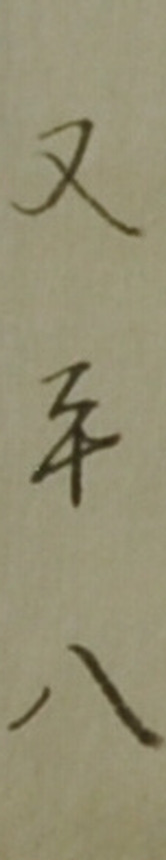又平八
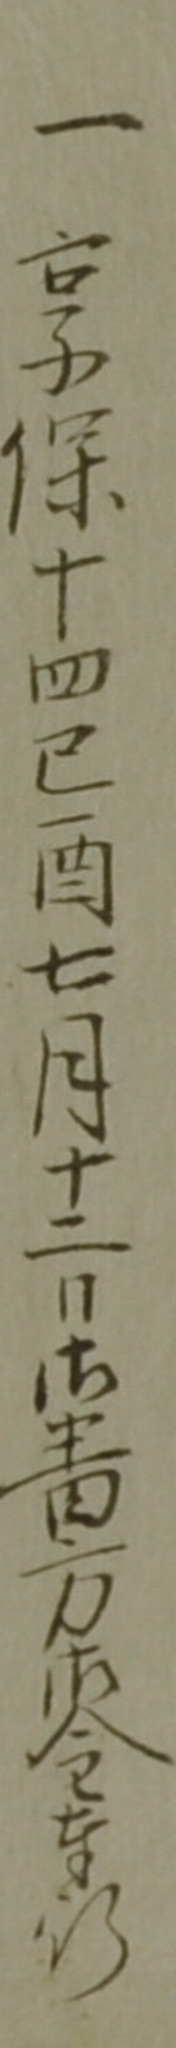一享保十四己酉七月十二日御番方御金奉行
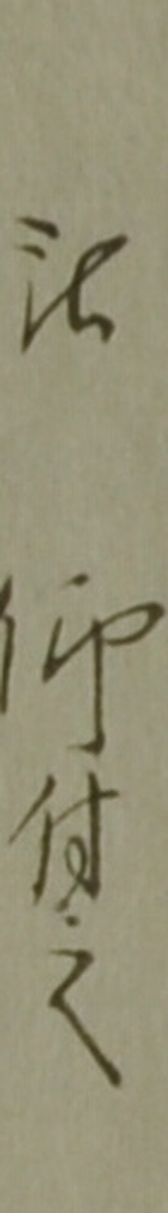被仰付之
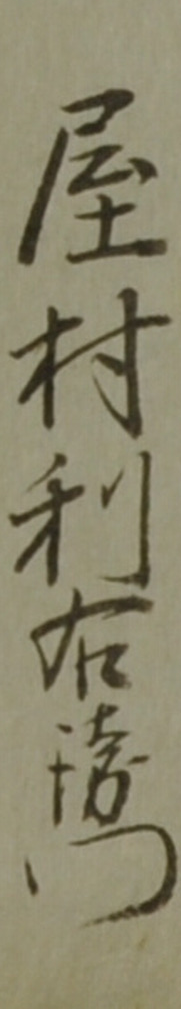屋村利右衛門
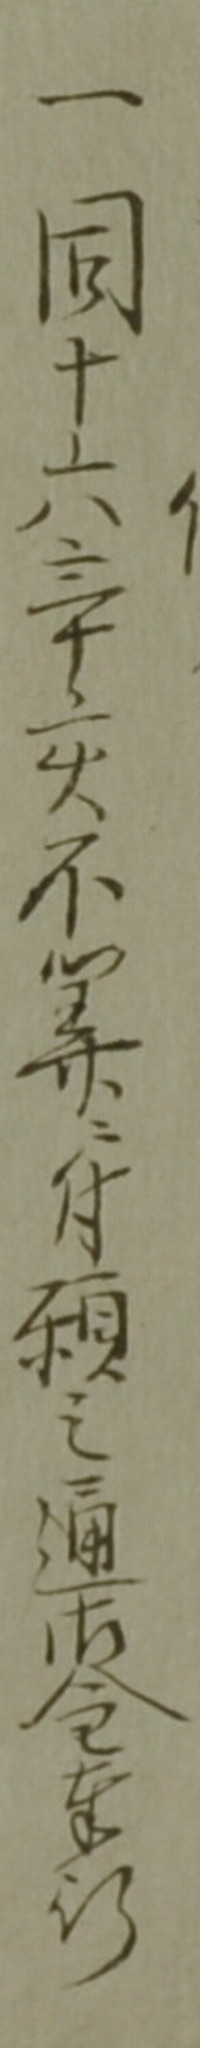一同十六辛亥不算付願之通御金奉行
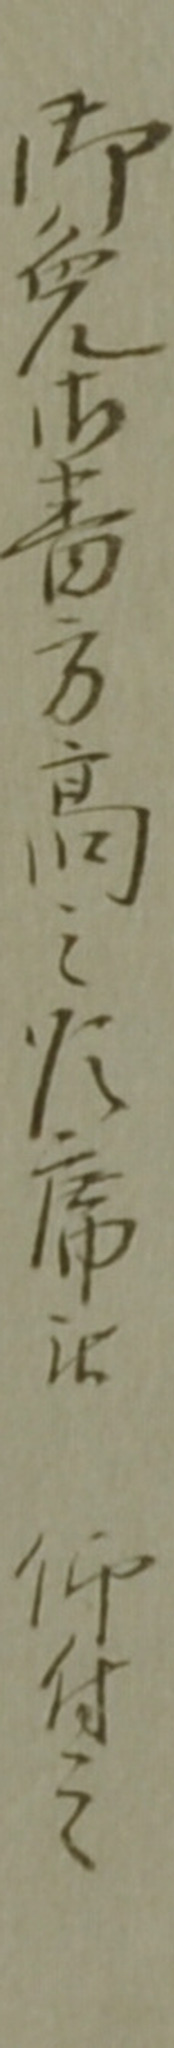御免御番方高之次席被仰付之
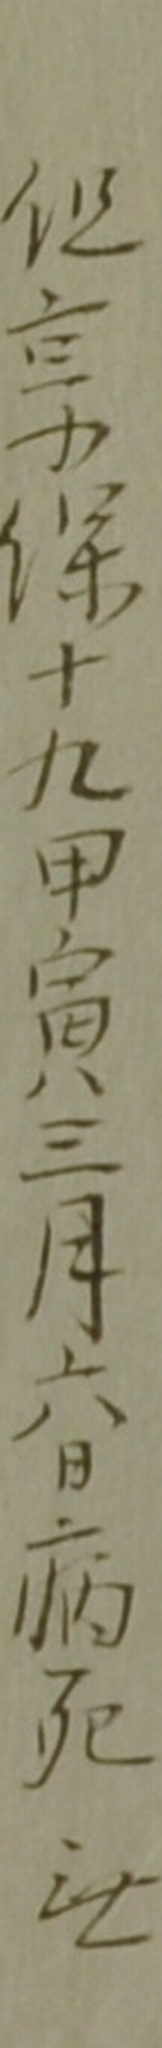但享保十九甲寅三月六日病死無
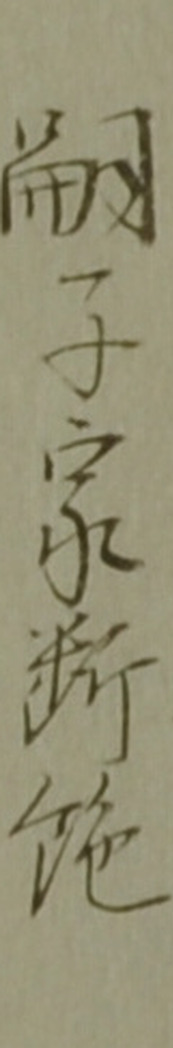嗣子家断絶
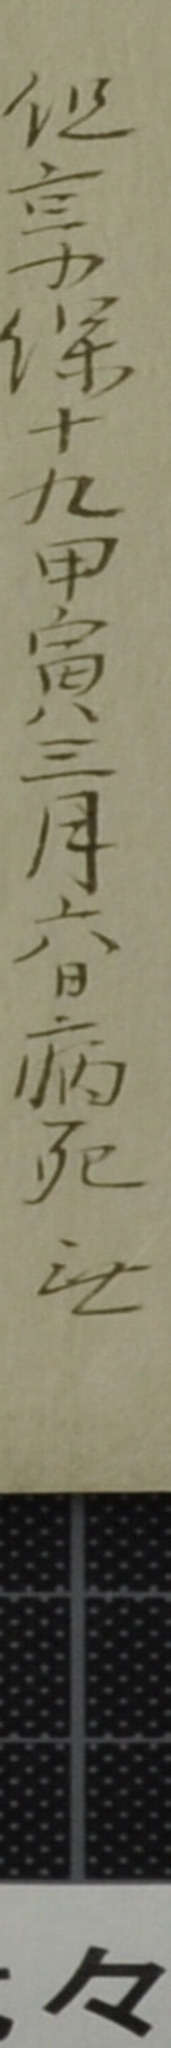但享保十九甲寅三月六日病死無
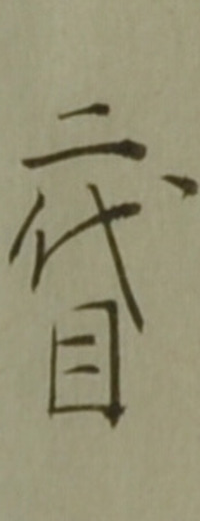二代目
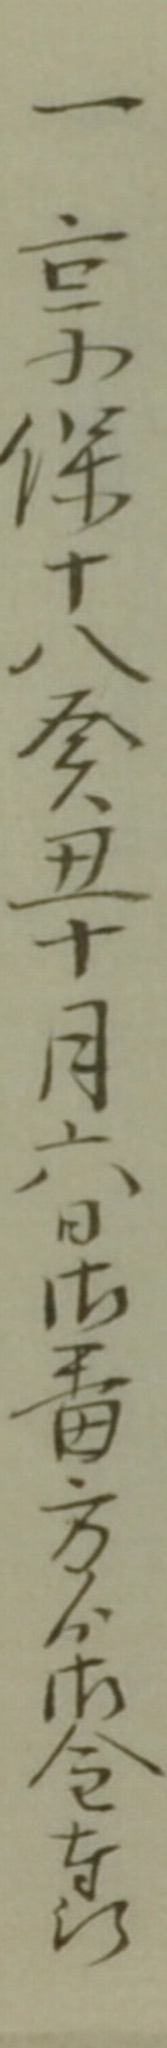一享保十八癸丑十月六日御番方ゟ御金奉行
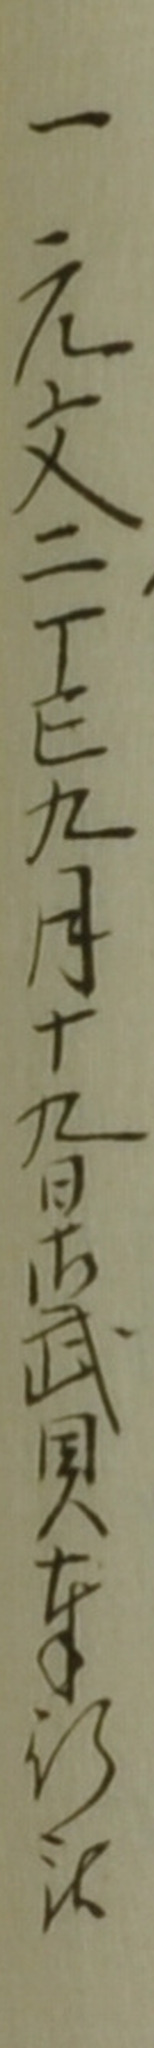一元文二丁巳九月十九日御武具奉行被
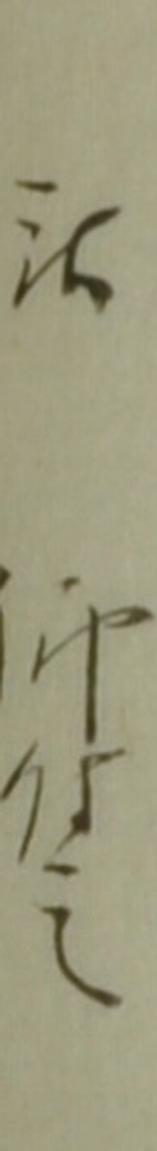被仰付之
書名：諸御役代々録（七）
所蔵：伊那市立高遠町図書館・合同会社AMANE
